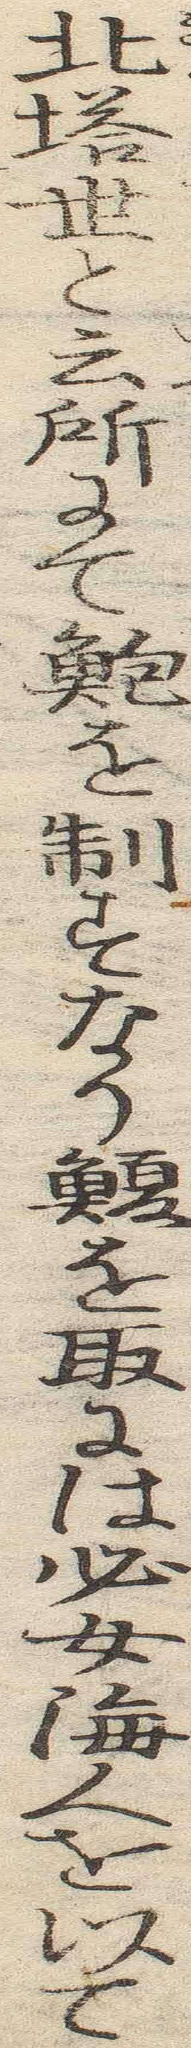北塔世と云所にて鮑を制すなり鰒を取には必女海人を以て
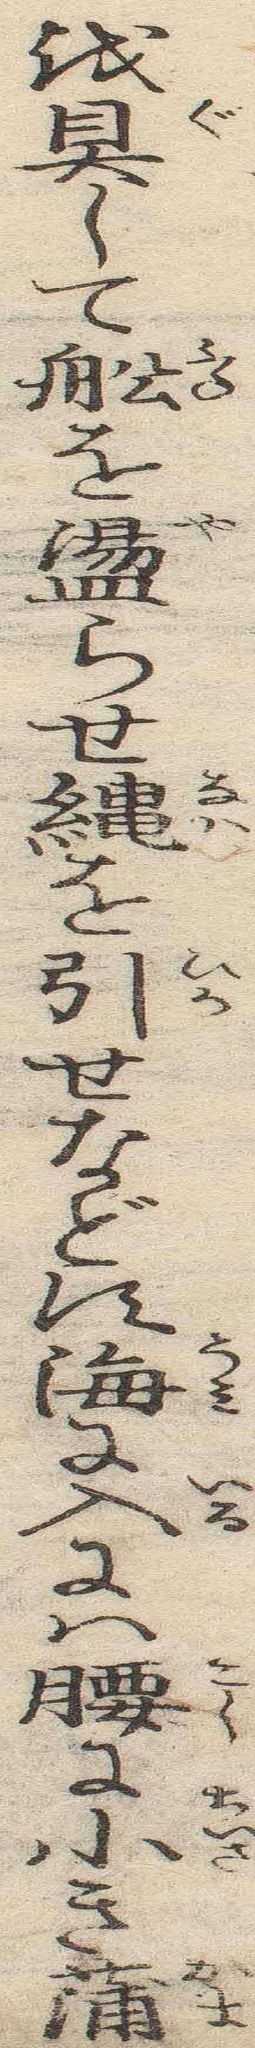を具して船を盪らせ縄を引せなどす海に入には腰に小き蒲
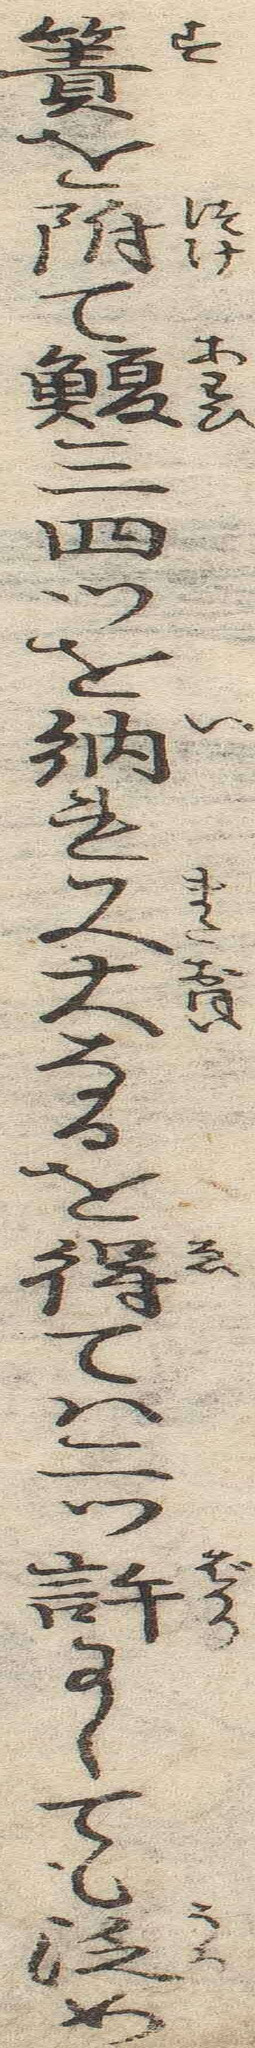簀を附て鰒三四ッを納れ又大なるを得ては二ッ許にしても泛め
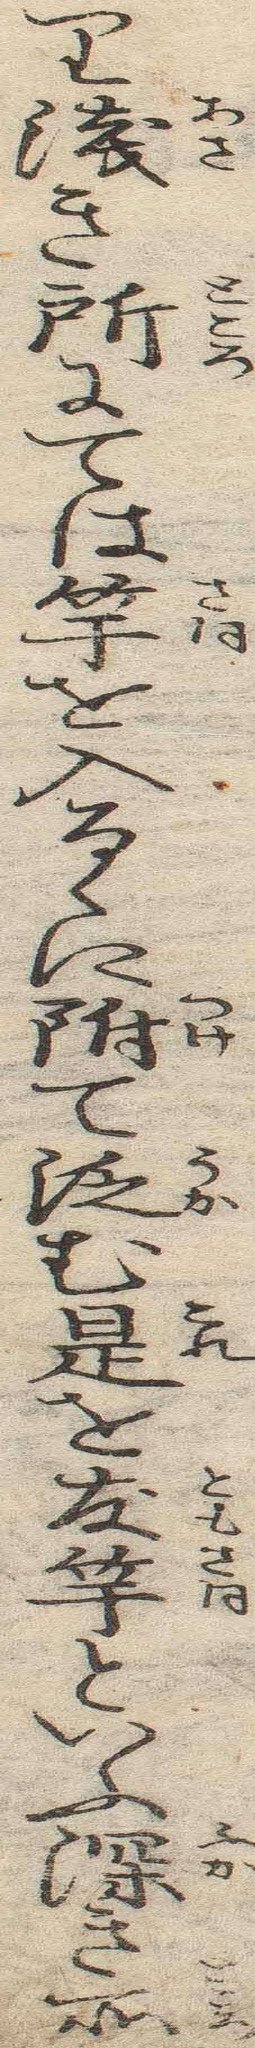り浅き所にては竿を入るゝに附て泛む是を友竿といふ深き所
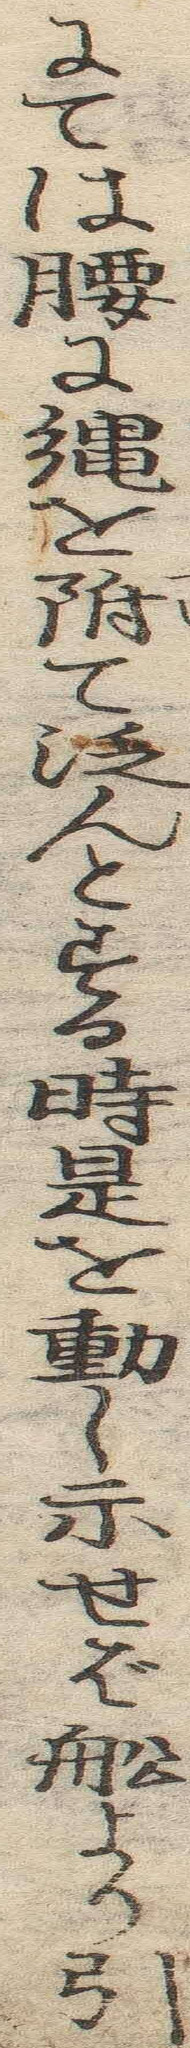にては腰に縄を附て泛んとする時是を動し示せば船より引
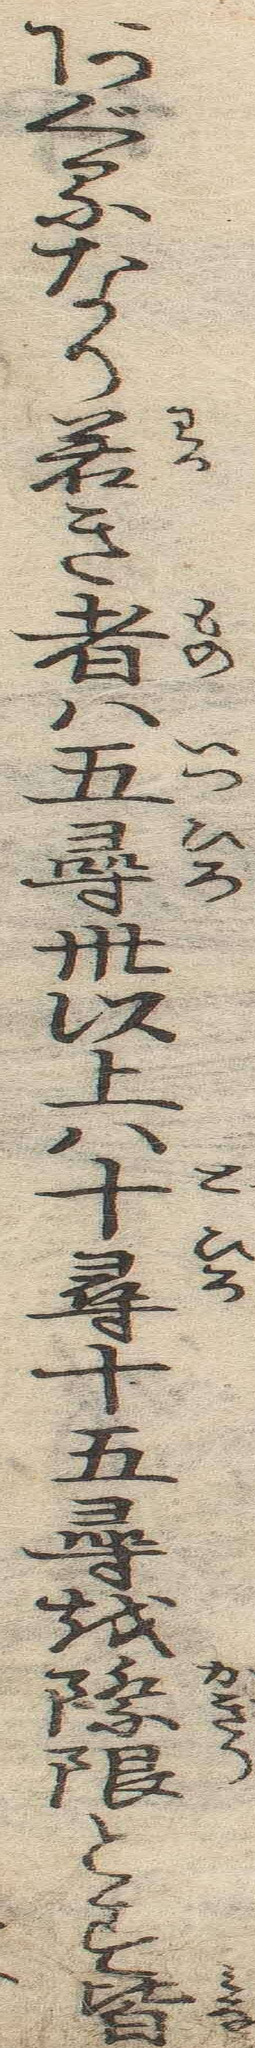あぐるなり若き者は五尋卅以上は十尋十五尋を際限とす皆
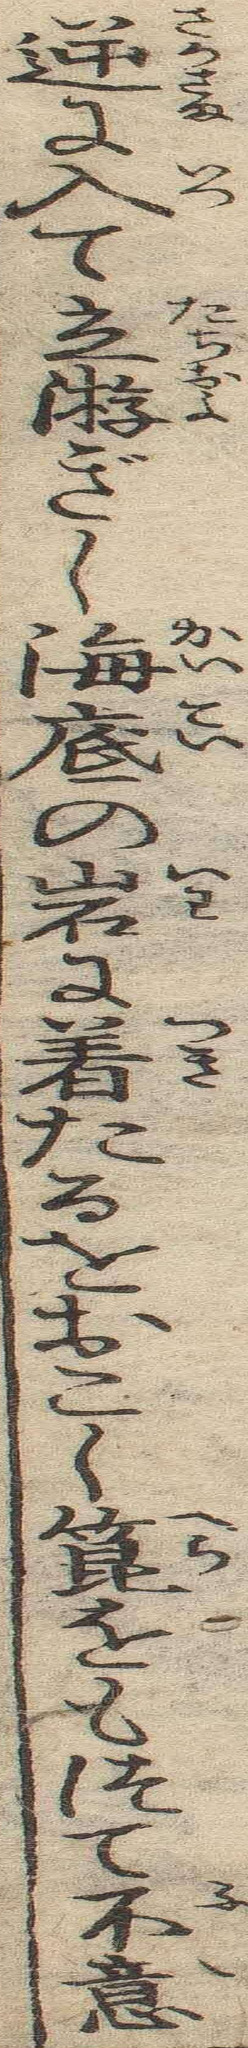逆に入て立游ぎし海底の岩に着たるをおこし箟をもつて不意

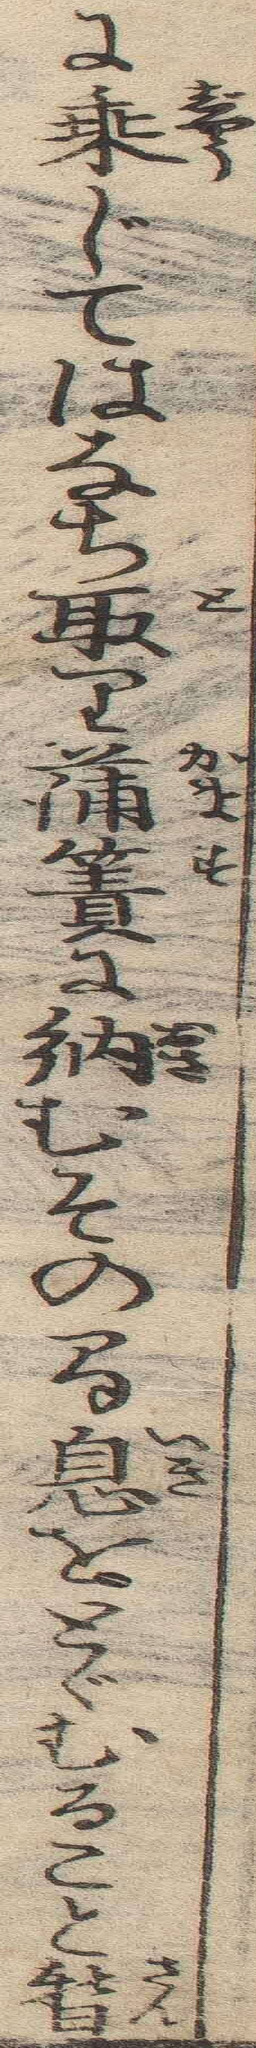に乗じてはなち取り蒲簀に納むその間息をとゞむること暫
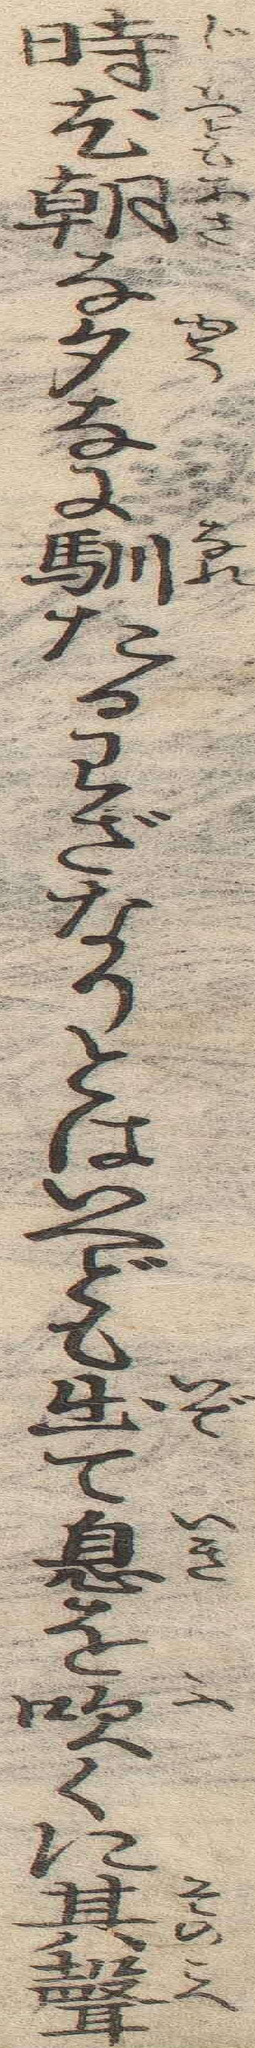時尤朝な夕なに馴たるわざなりとはいへども出て息を吹くに其声
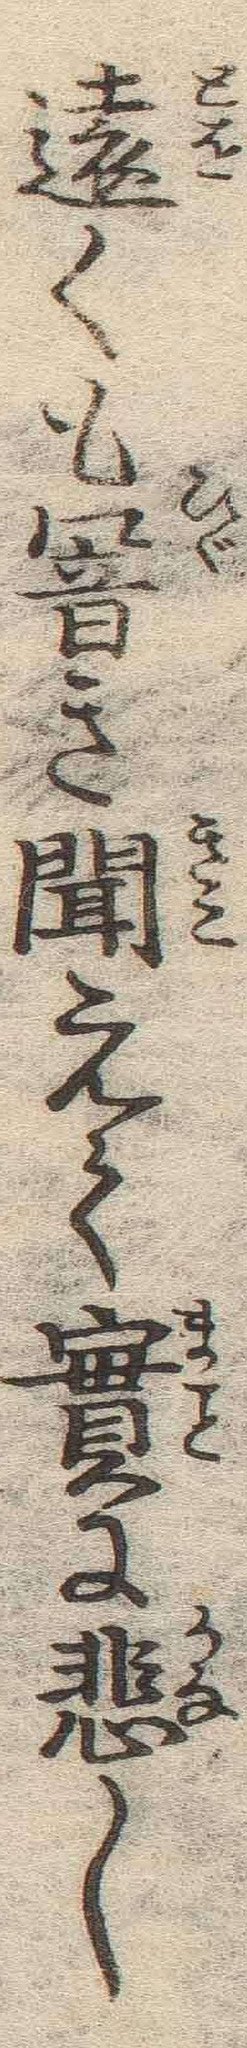遠くも響き聞えて実に悲し
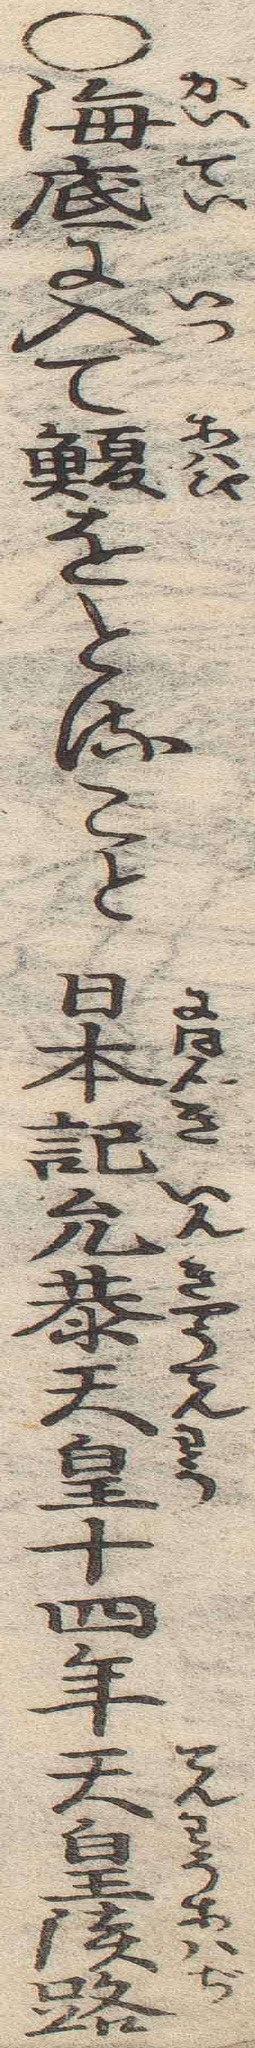○海底に入て鰒をとること日本記允恭天皇十四年天皇淡路
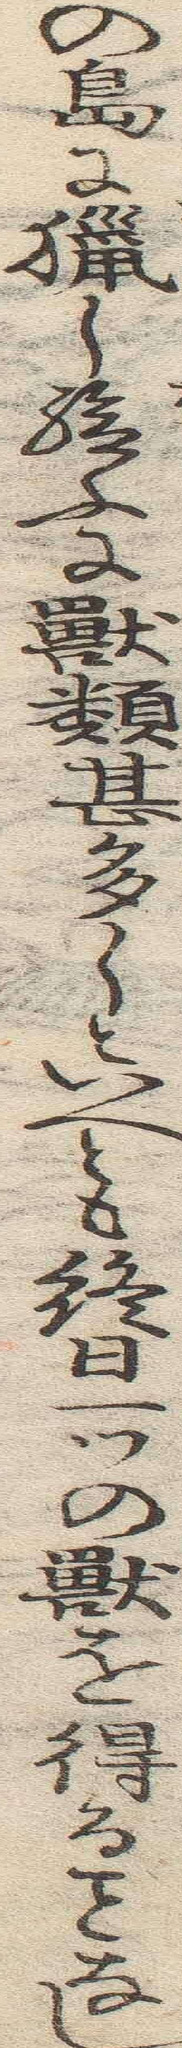の島に猟し給ふに獣類甚多しといへとも終日一ッの獣を得ることなし
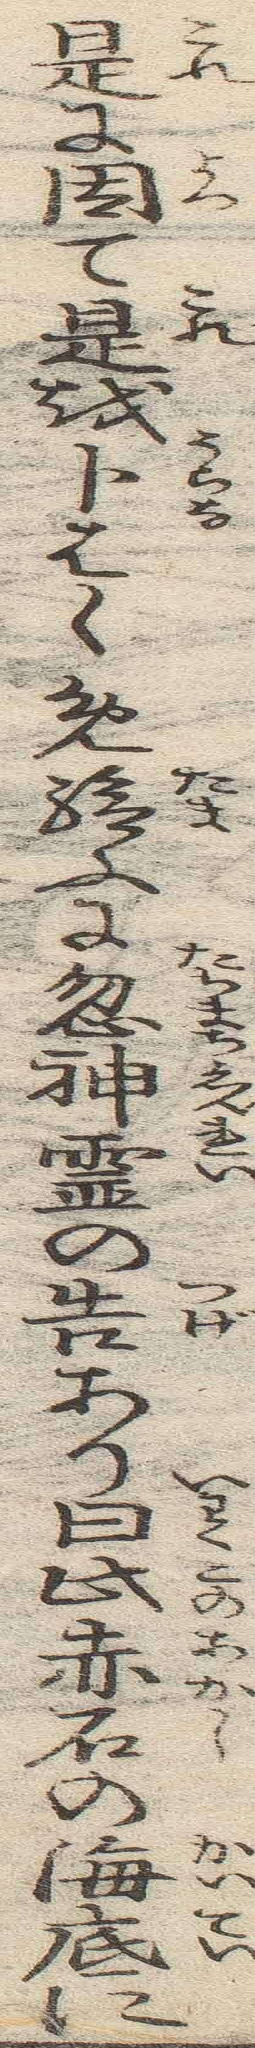是に因て是を卜はしめ給ふに忽神霊の告あり曰此赤石の海底に
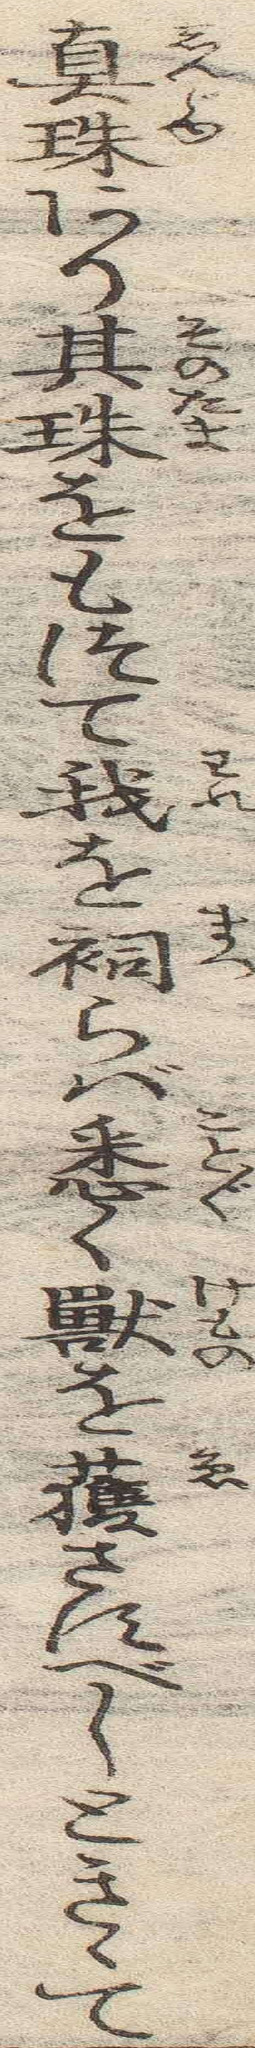真珠あり其珠をもつて我を祠らば悉く獣を獲さすべしときゝて
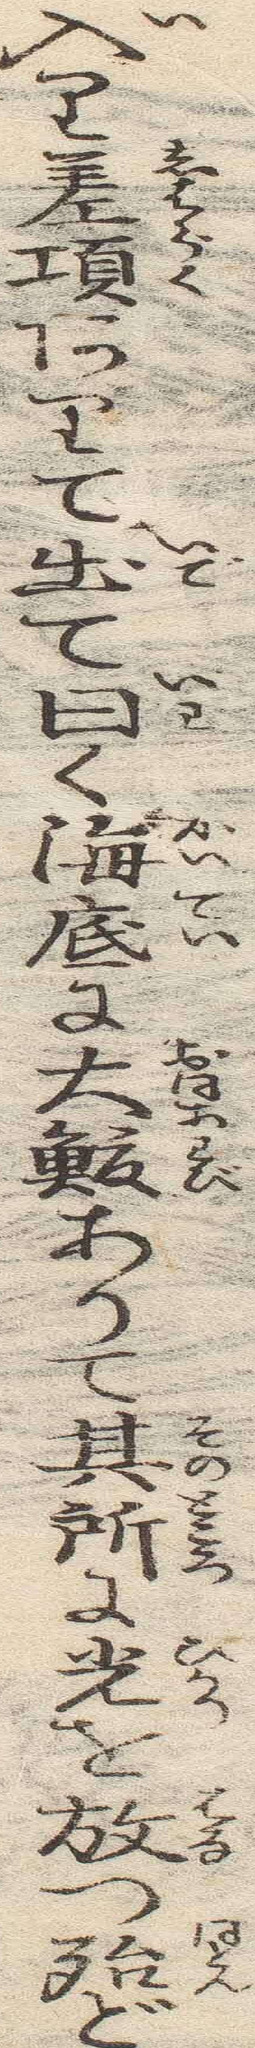入り差項ありて出て曰く海底に大鰒ありて其所に光を放つ殆ど
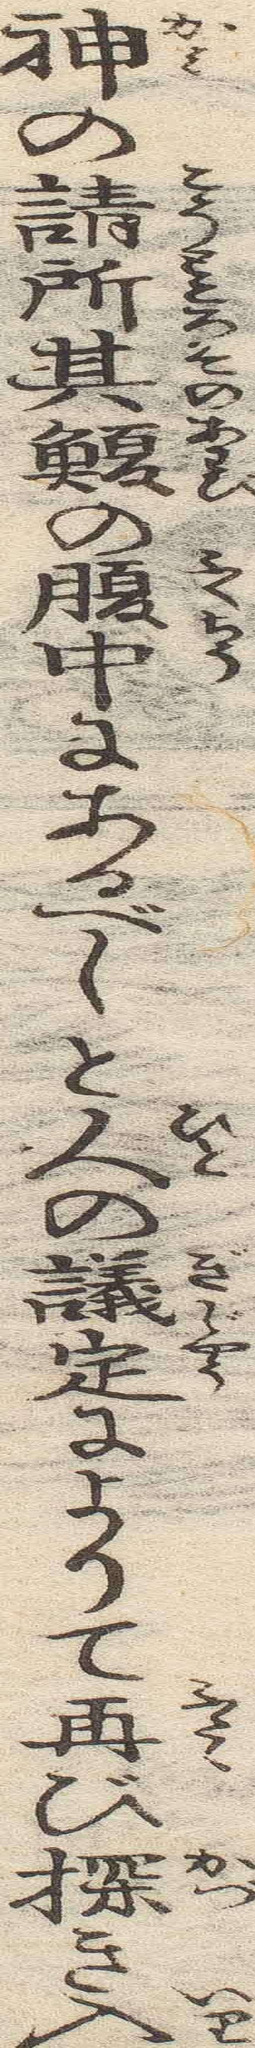神の請所其鰒の腹中にあるべしと人の議定によりて再び探き入
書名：日本山海名産図会
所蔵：東京学芸大学附属図書館 国文学研究資料館
